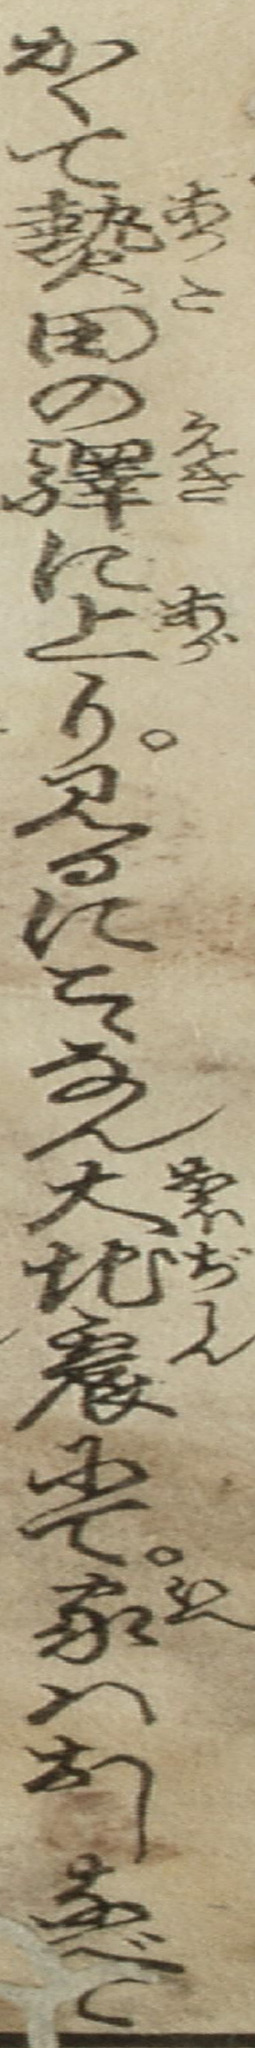かくて熱田の駅に上り。見るにこゝなん大地震にて。家はおしなべて
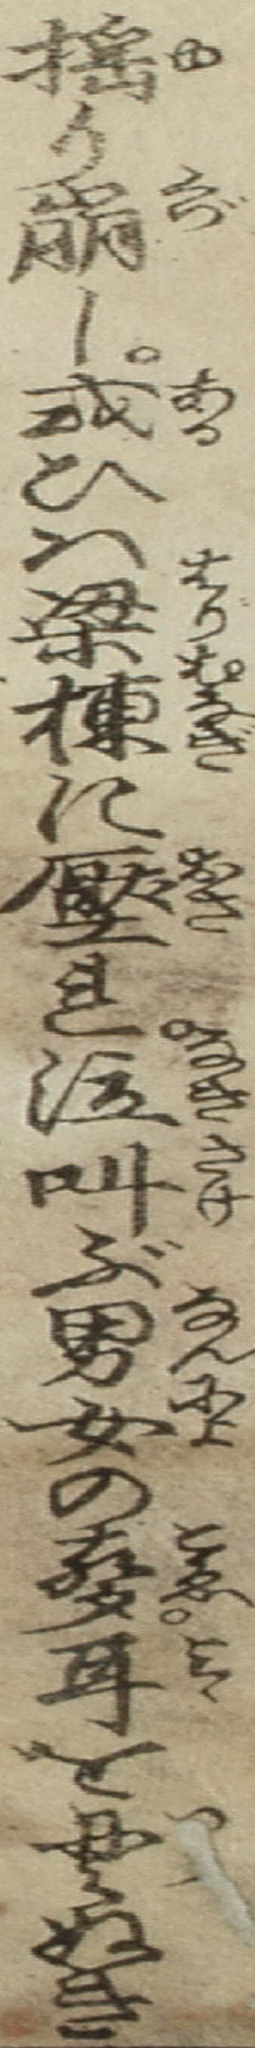揺り崩し。或ひは梁棟に壓れ。泣叫ぶ男女の声耳を貫ぬき
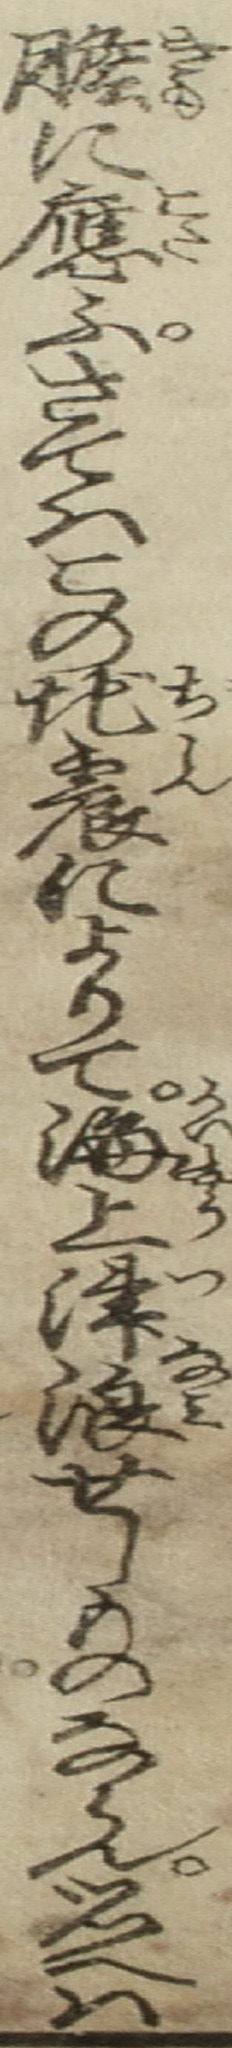膽に応ふ。さてはこの地震によりて。海上津浪せしものならん。思へば
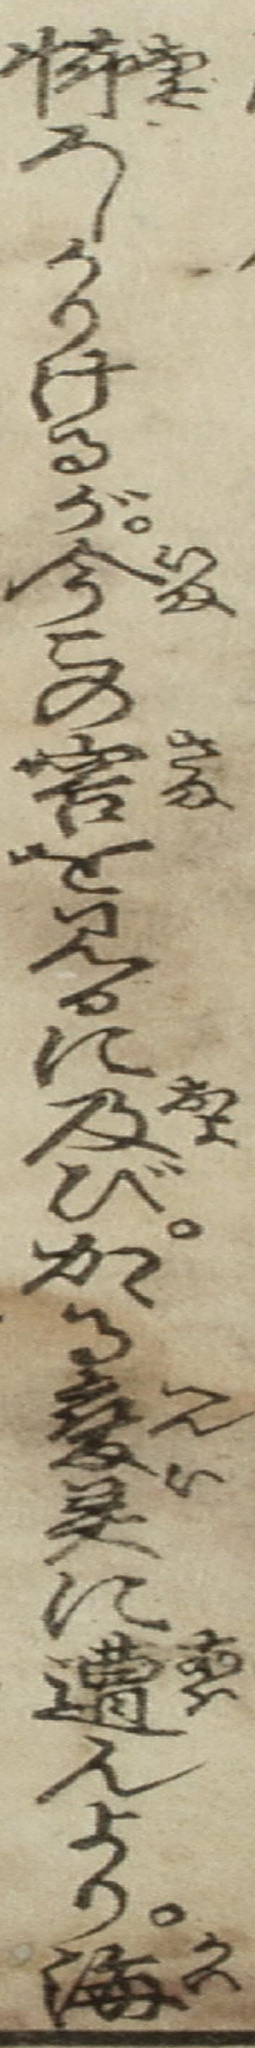怖ろしかりけるが。今この容を見るに及び。かゝる変異に遭んより海
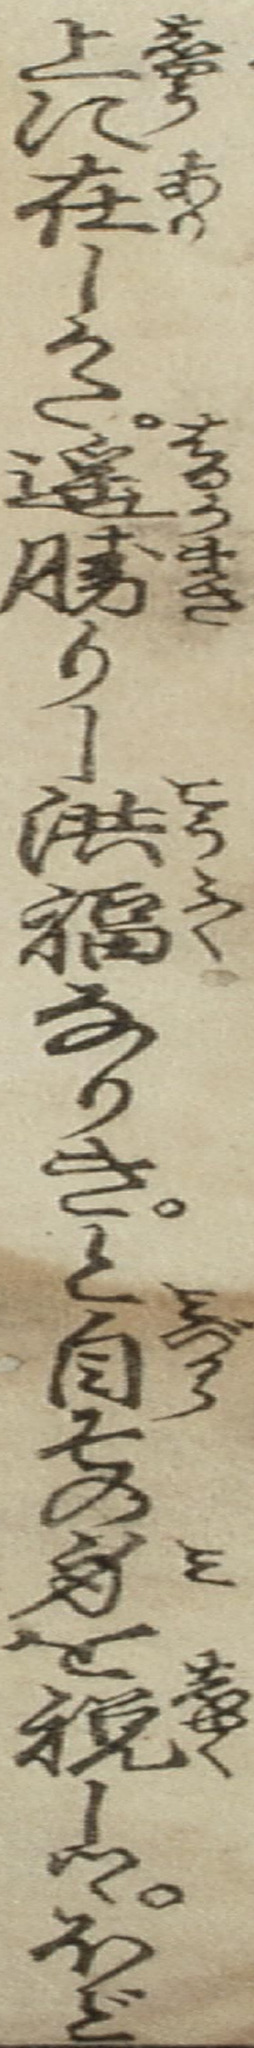上に在しかた。遥勝りし洪福なりき。と自その身を祝しッゝほど
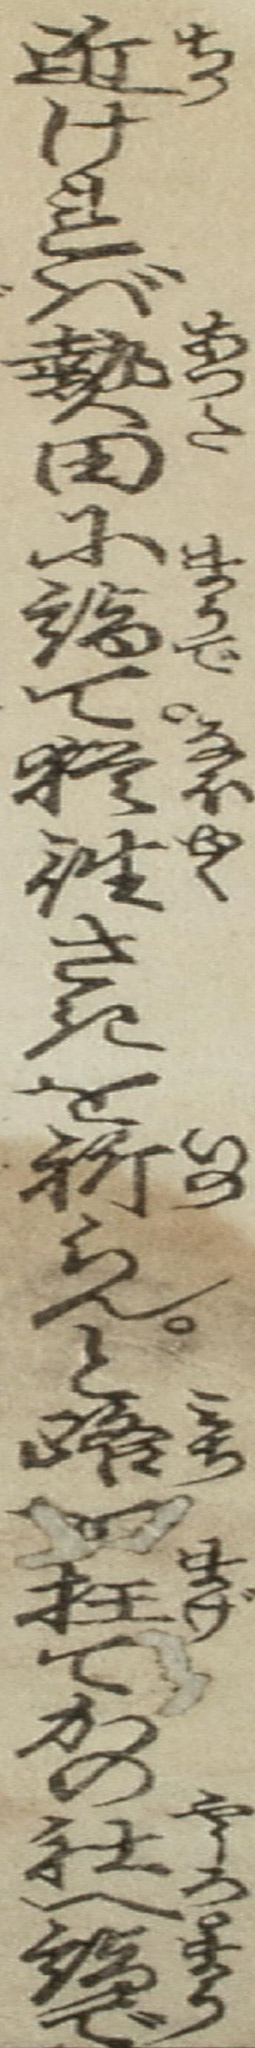近ければ熱田に詣で。猶往さきを祈らん。と路を枉てかの社へ詣で
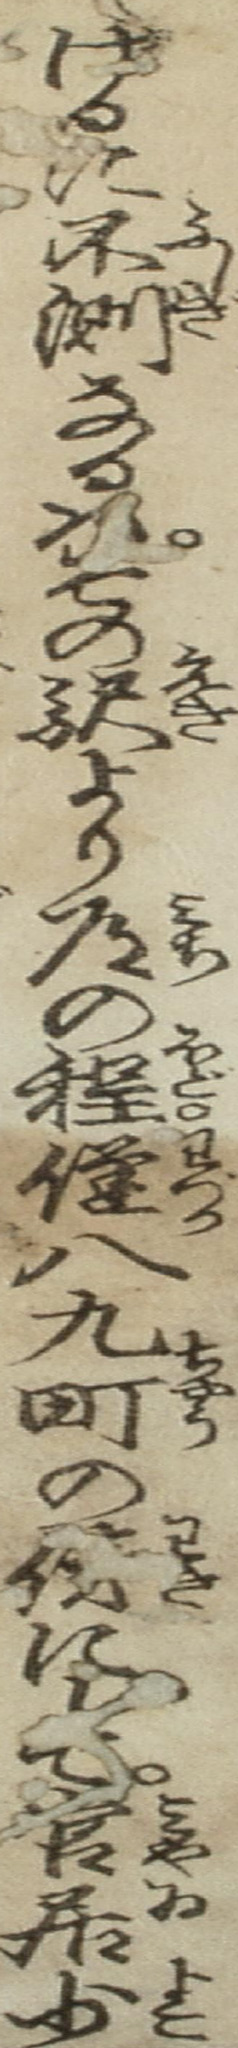けるに不測なるは。この駅より道の程。僅八九町の傍にして。宮居少
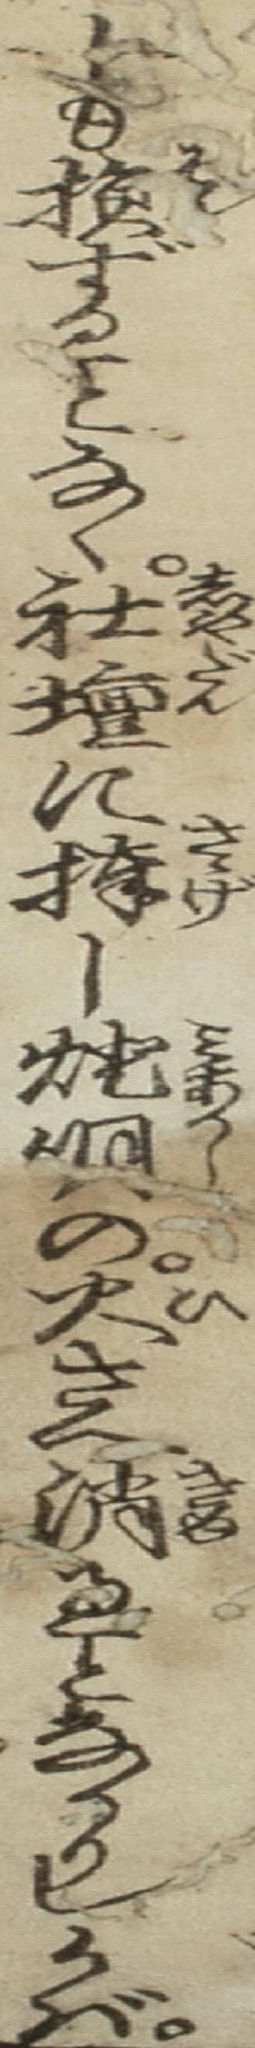しも損ずることなく。舎壇に捧し燈明の。火さえ消ることなかりしかば。
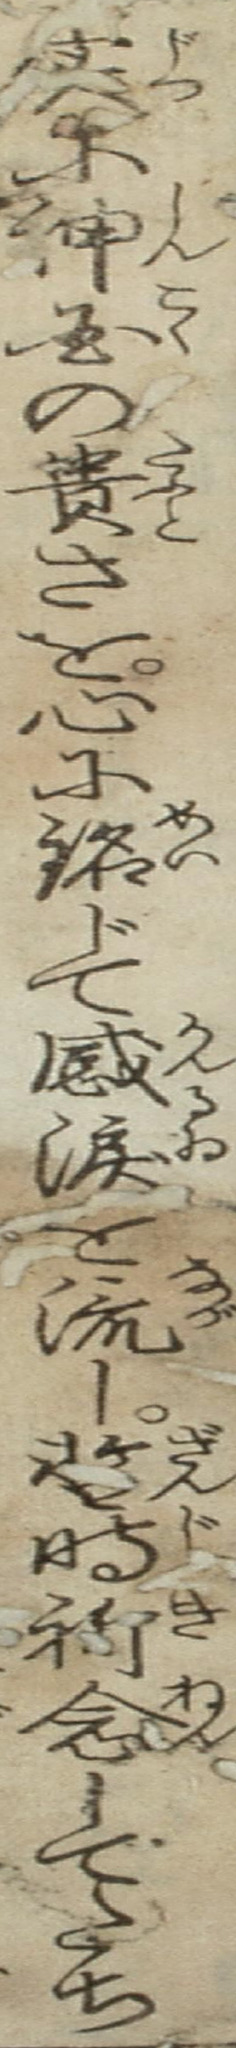実に神国の貴さを。心に銘じて感涙を流し。暫時祈念してたち
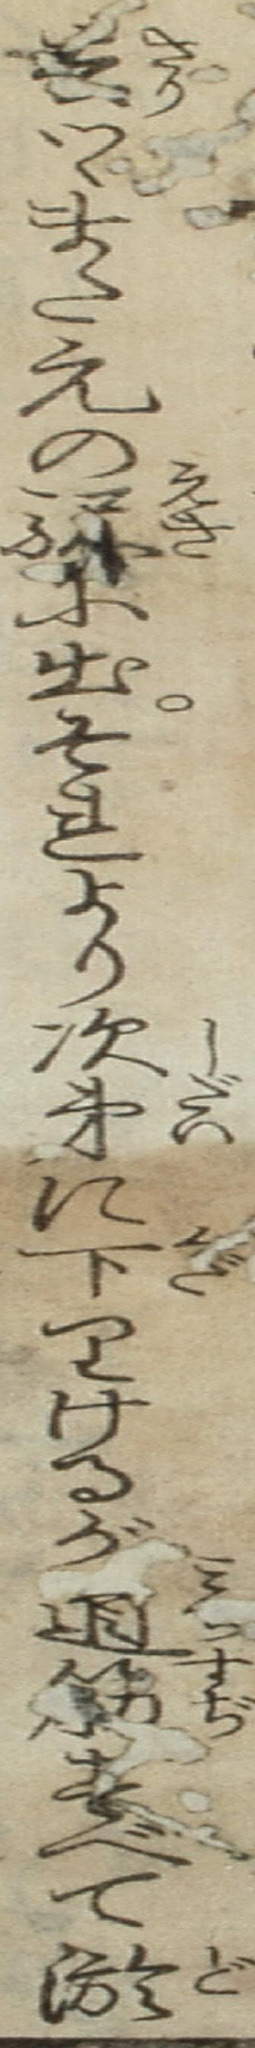去ッゝまた元の駅に出。それより次第に下りけるが。道筋すべて游
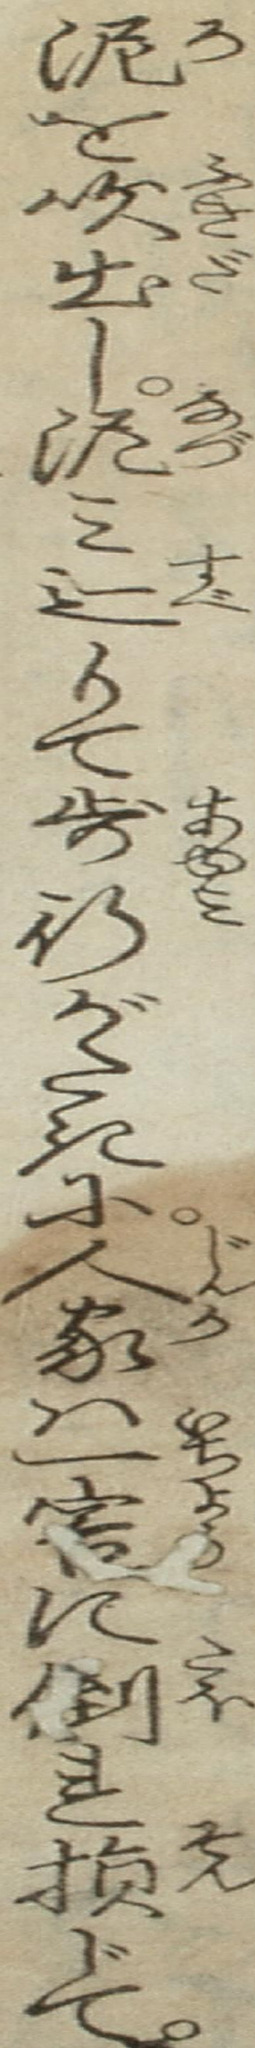泥を吹出し泥み辷りて歩行がたきに。人家は一容に倒れ損じて。
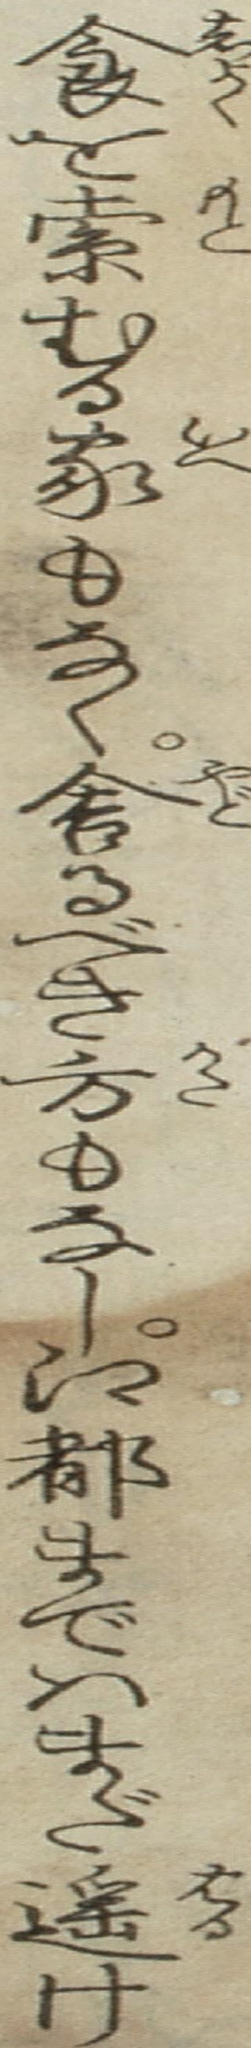食を索むる家もなく。舎るべき方もなし。江都まではまだ遥け
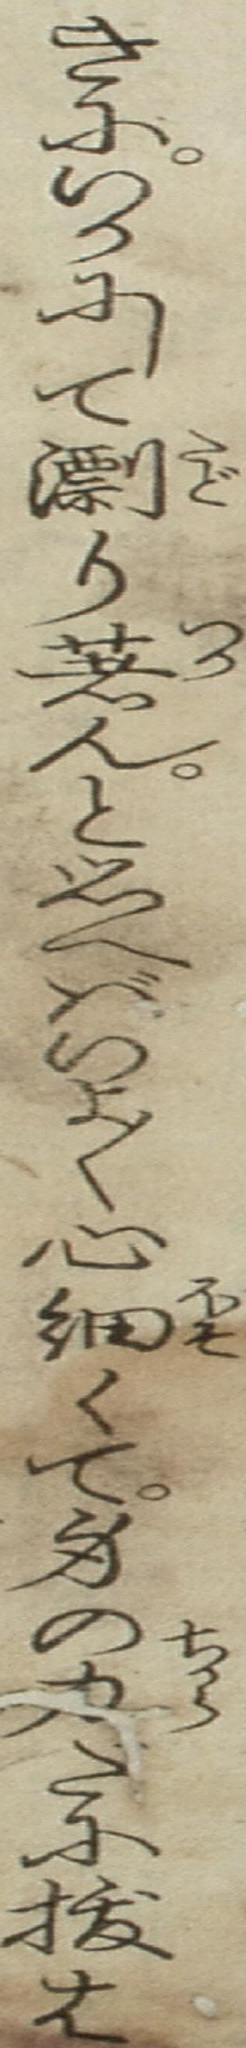きに。いかにして漂り著ん。と思へばいよ〳〵心細くて。身の力だに抜けは
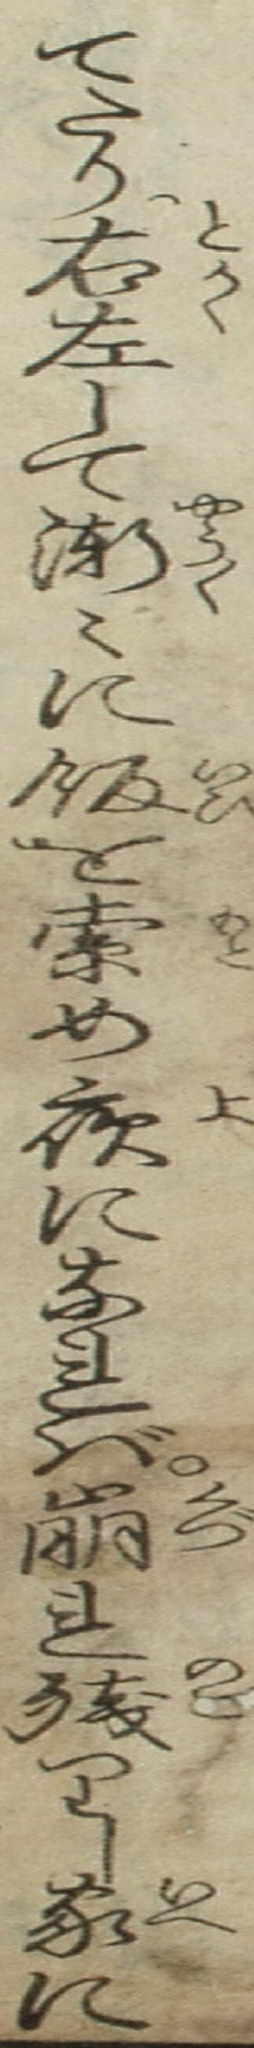てさり。右左して漸々に飯を索め夜にならば。崩れ残りし家に
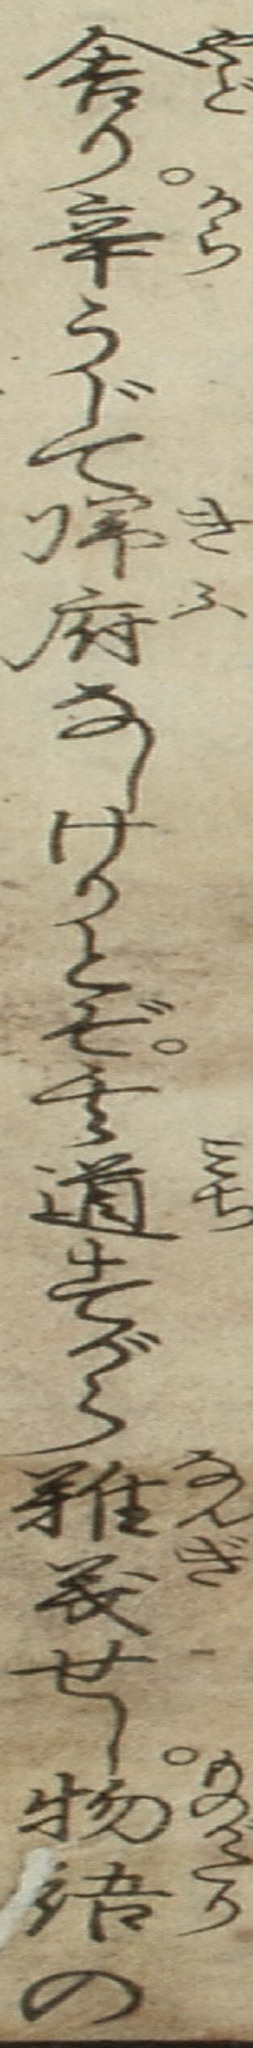舎り。辛うじて帰府なしけりとぞ。其道すがら難義せし。物語の
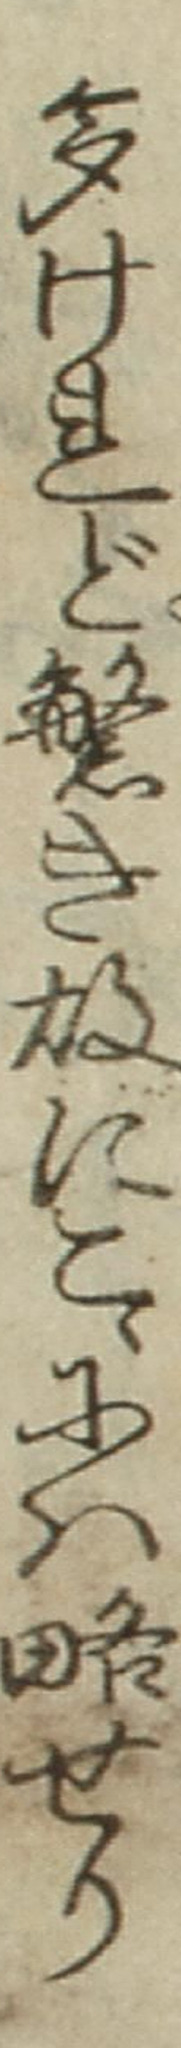多けれど。繁き故にこゝには略せり
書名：安政見聞録　中
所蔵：東京大学地震研究所図書室 Earthquake Research Institute Library, The University of Tokyo, JAPAN
